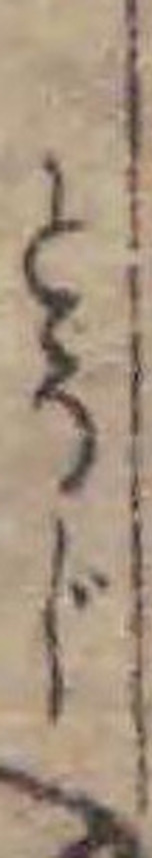とうじ
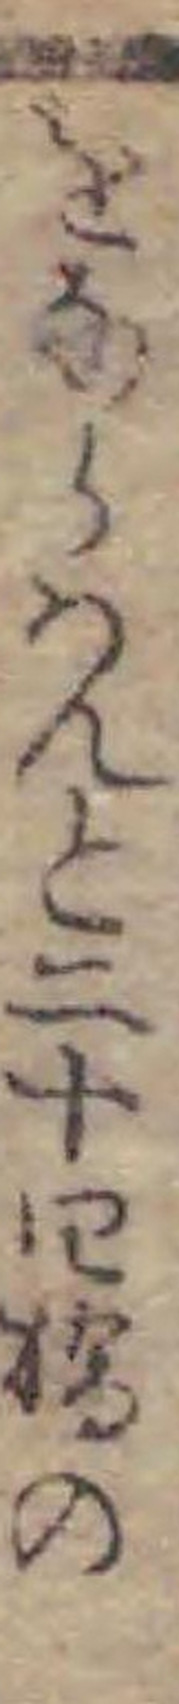をならはんと二十四橋の
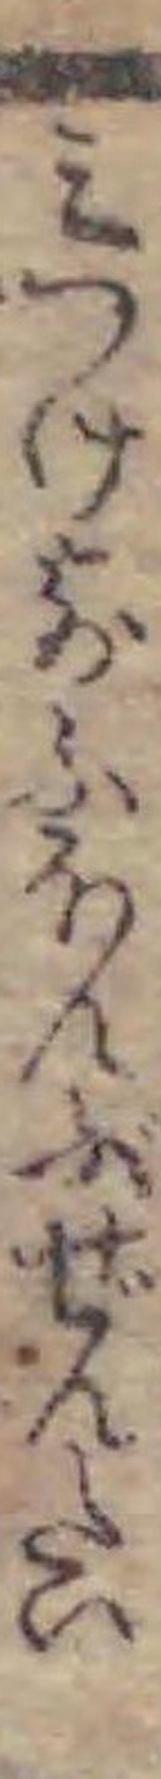みつけ前ふほんぶぜんたい
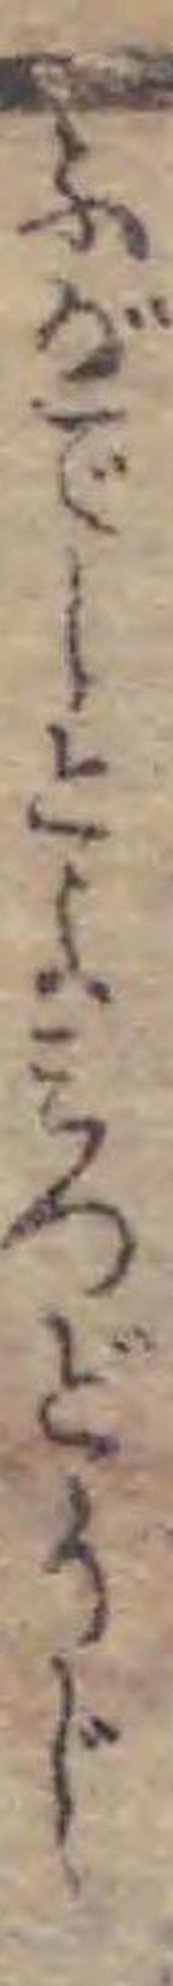ふがでしとよみつどうじ
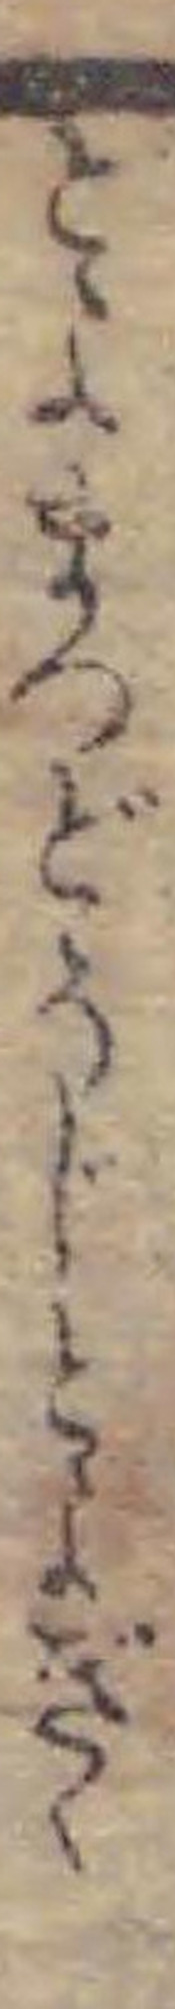とよまつどうじとよぎく
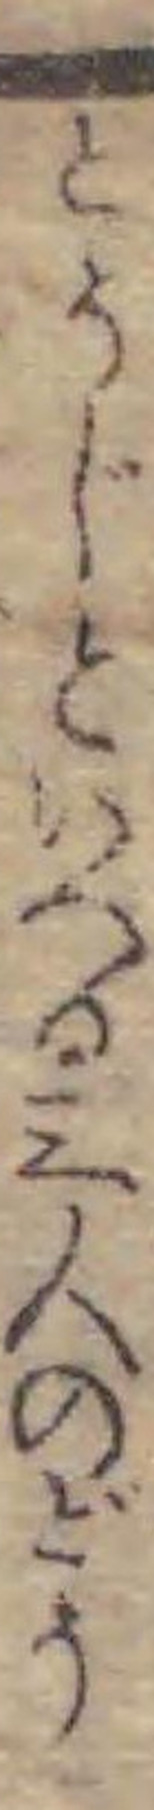とうじといへる三人のどう
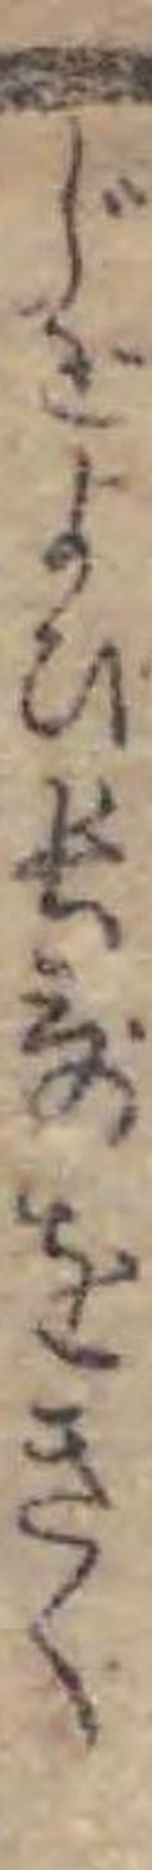じをよび長哥をきく
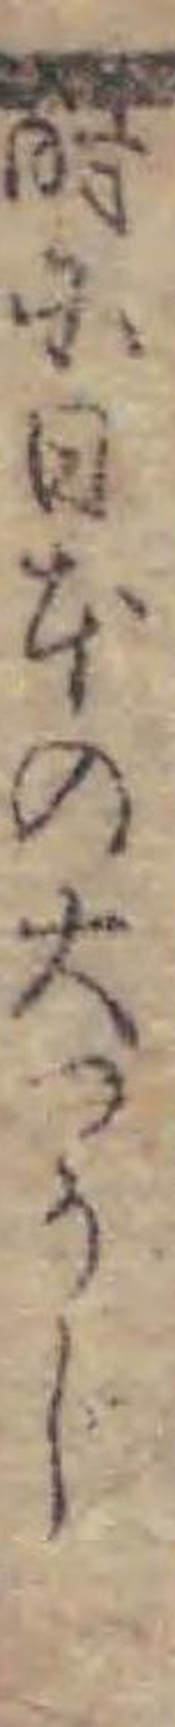時に日本の大つうじ
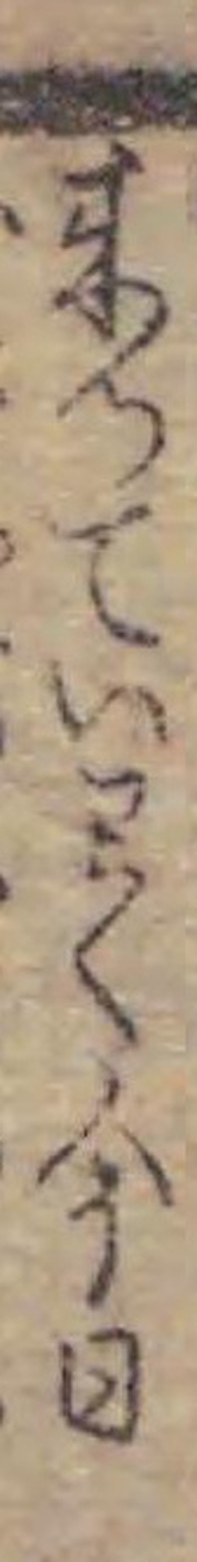来つていわく今日
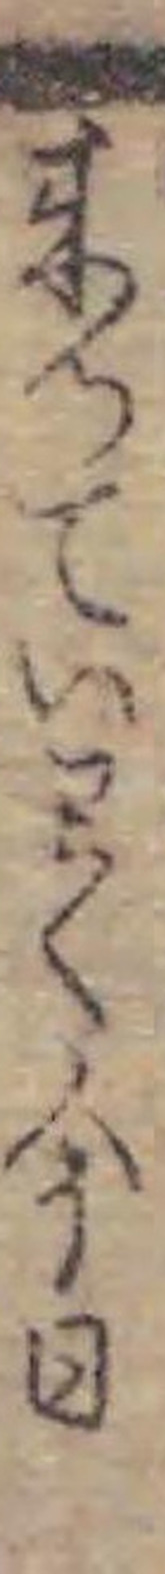来つていわく今日
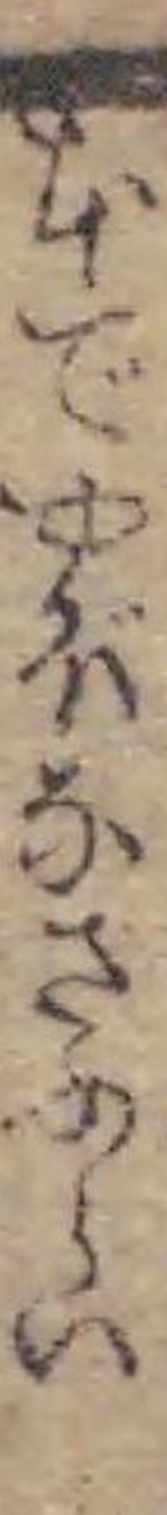本でやぼなさふらい
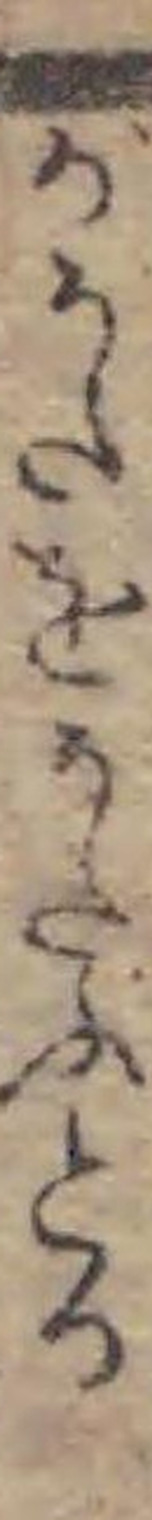がうたをうたふとか
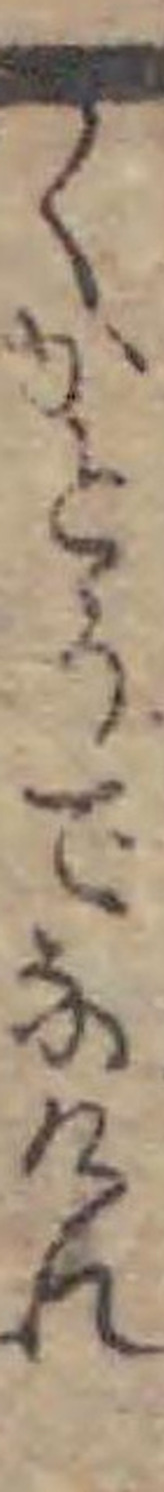くかとうでなけれ
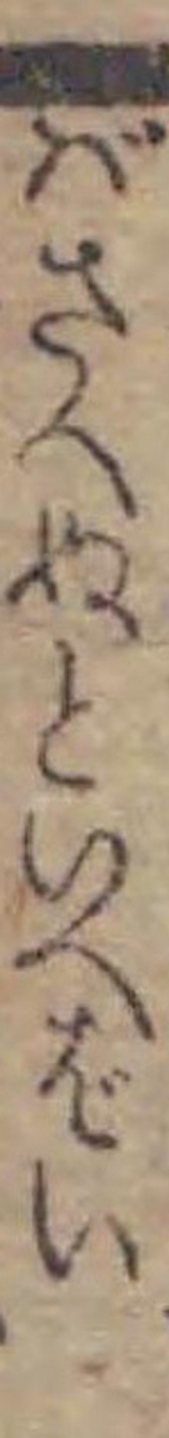ばさへぬといへばい
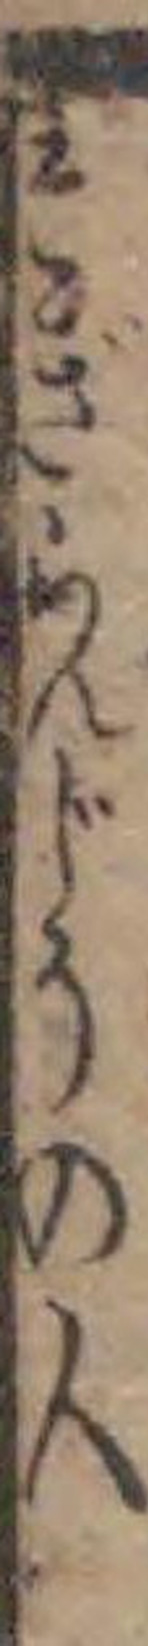そぎらんじうの人
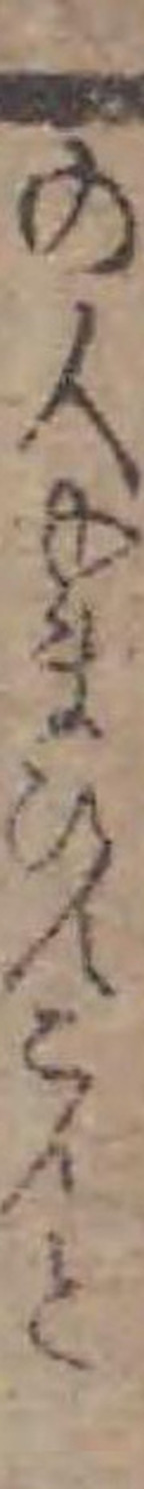の人やまひんこんと
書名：此奴和日本 : 2巻
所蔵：国立国会図書館 National Diet Library, JAPAN
